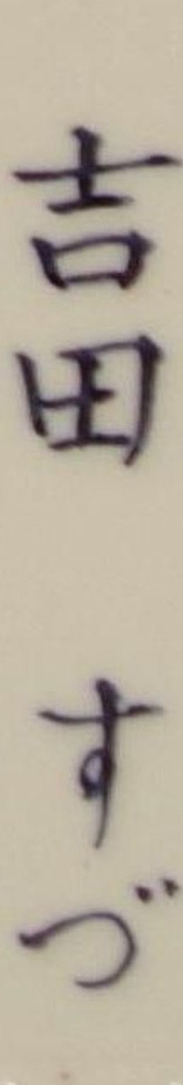吉田すづ
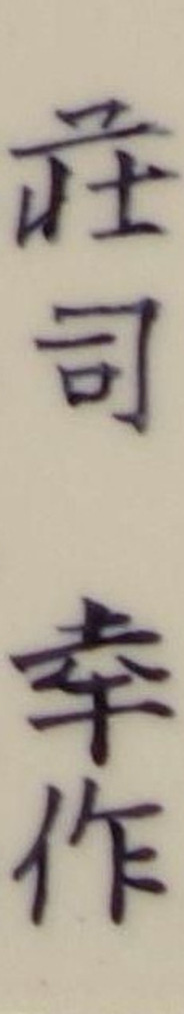荘司幸作
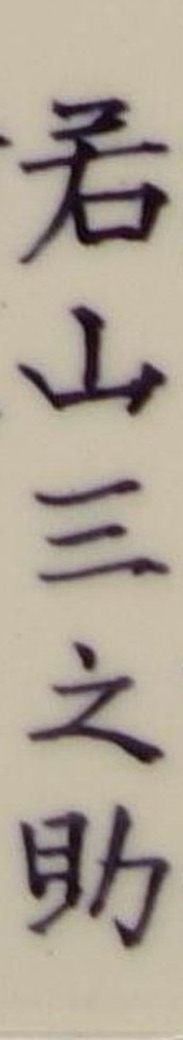若山三之助
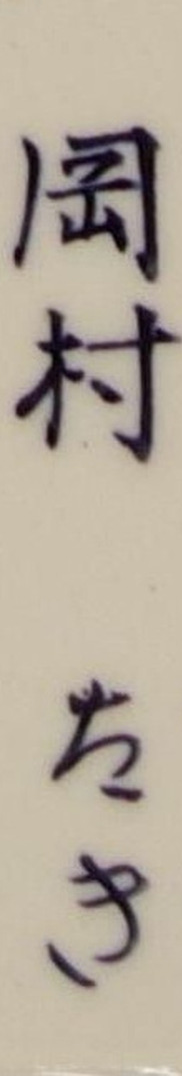岡村太き
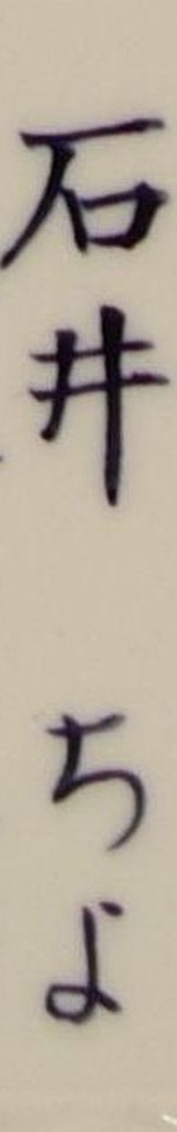石井ちよ
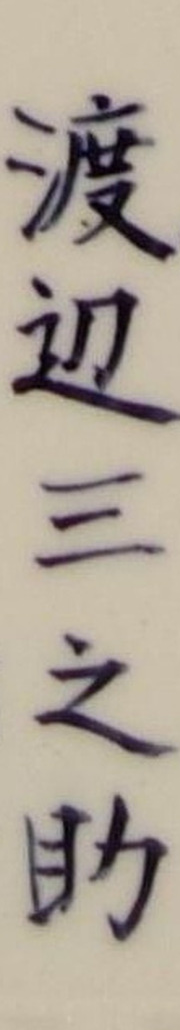渡辺三之助
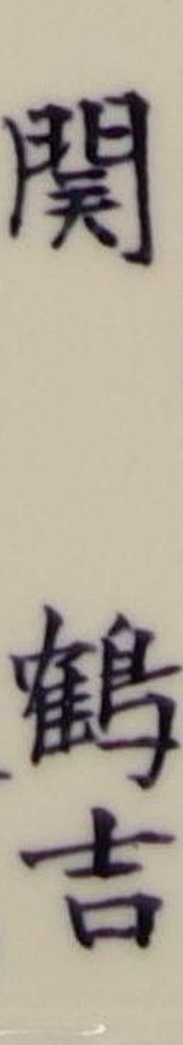関鶴吉
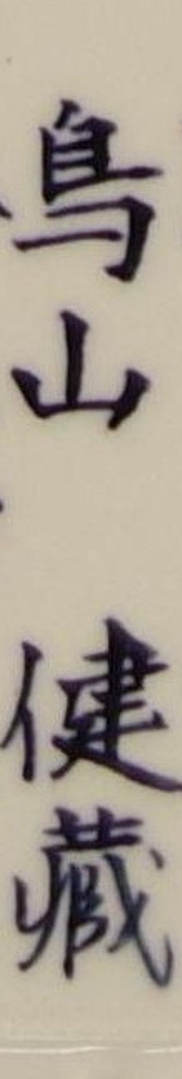鳥山健蔵
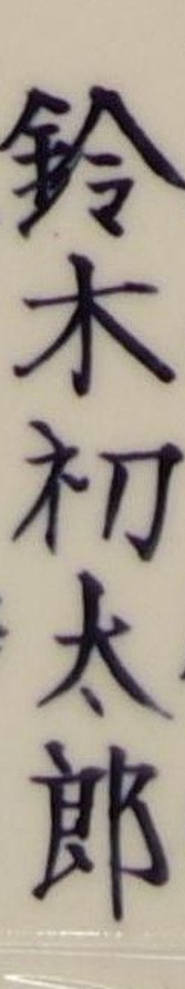鈴木初太郎
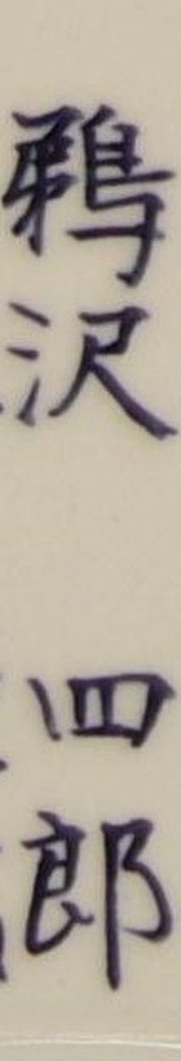鵜沢四郎
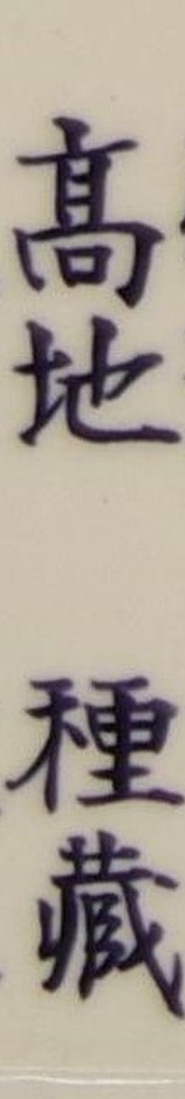高地種蔵
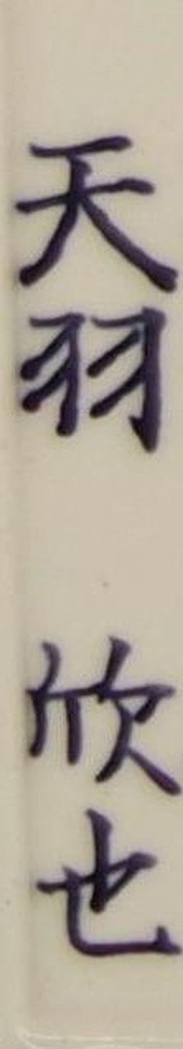天羽欣也

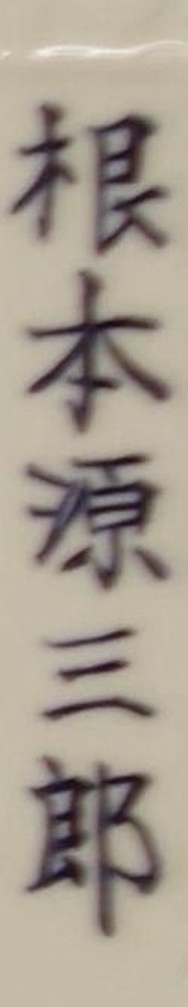根本源三郎
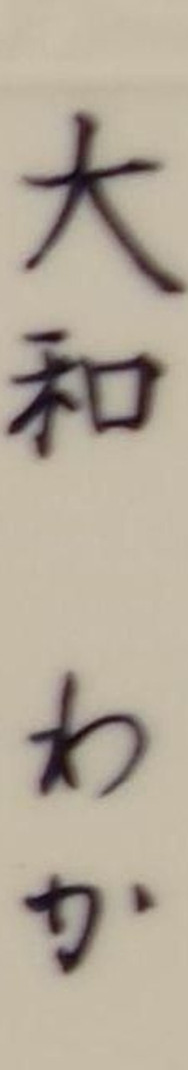大和わか
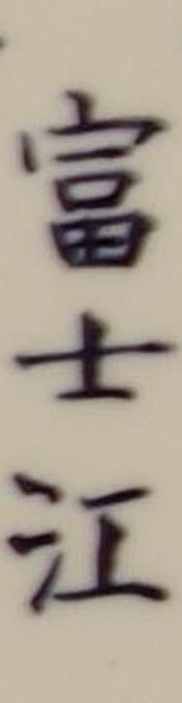富士江
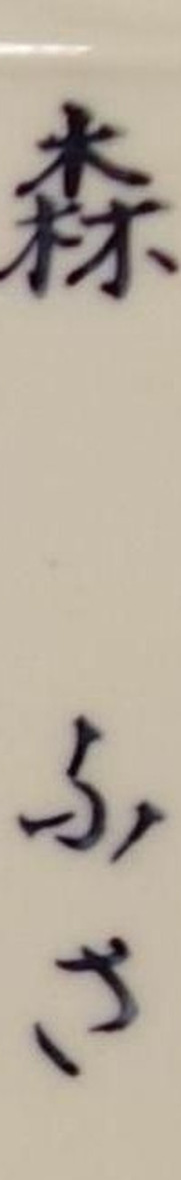森ふさ
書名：M~S
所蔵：高野山金剛峯寺
